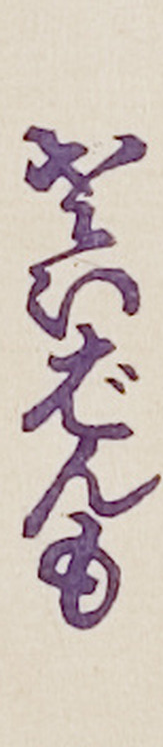さいばんも
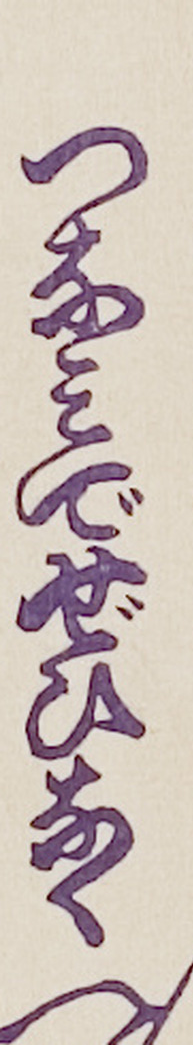つなミでぜひなく
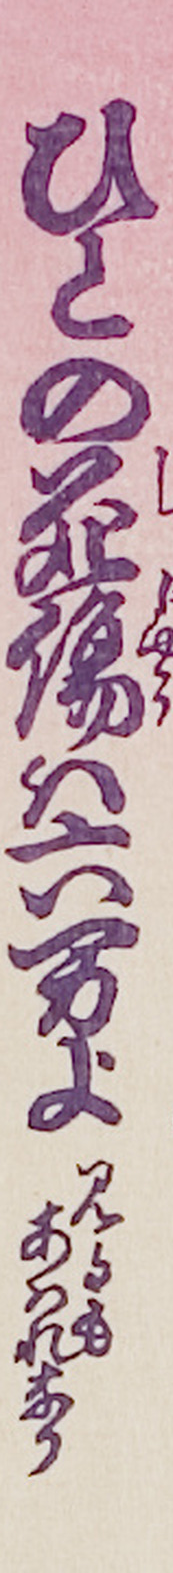ひとの死傷ハ六万よ見るも
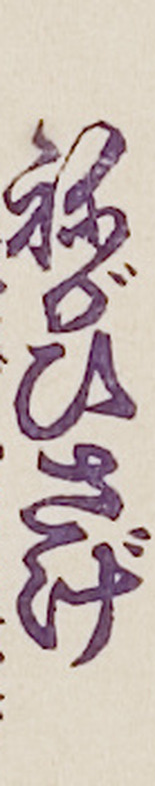ねがひさげ
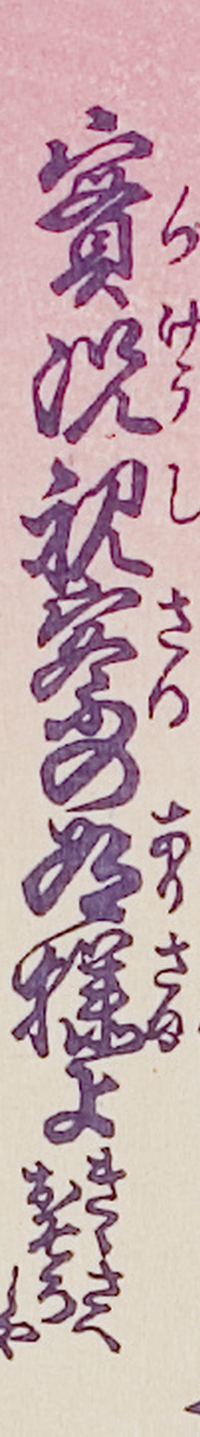実況視察の有様よきしさへ
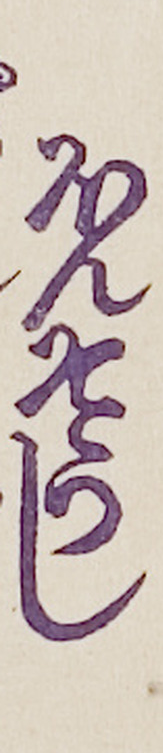ほんそうし
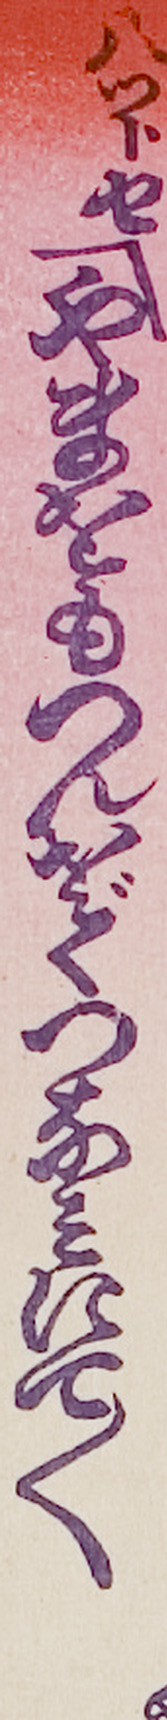八ツトセ乁やまをもつんざくなミにて〳〵
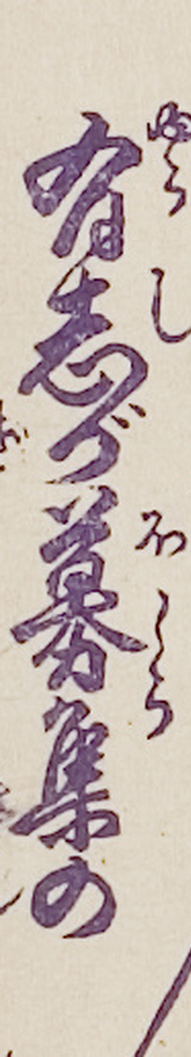有志が募集の
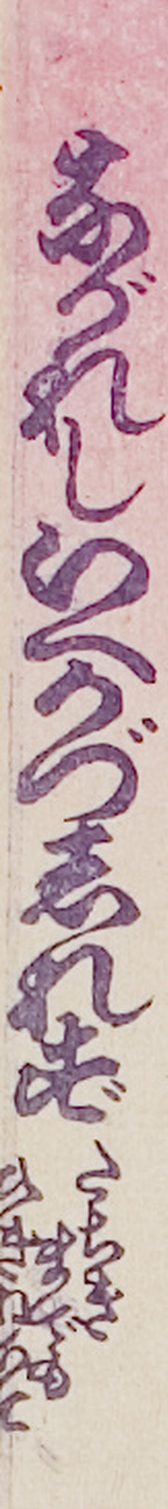ながれし伊へかづしれずたちき
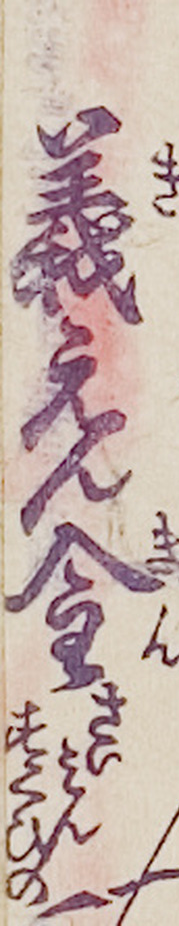義えん金さい
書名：北陸三県大つなミ一ツトセぶし
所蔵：東京大学総合図書館 General Library in the University of Tokyo, JAPAN
